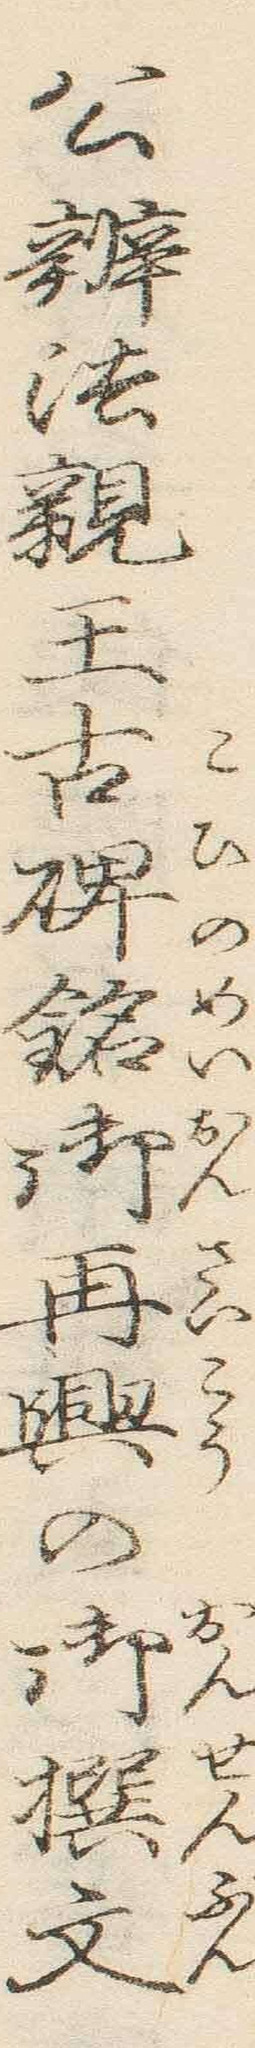公辨法親王古碑銘御再興の御撰文
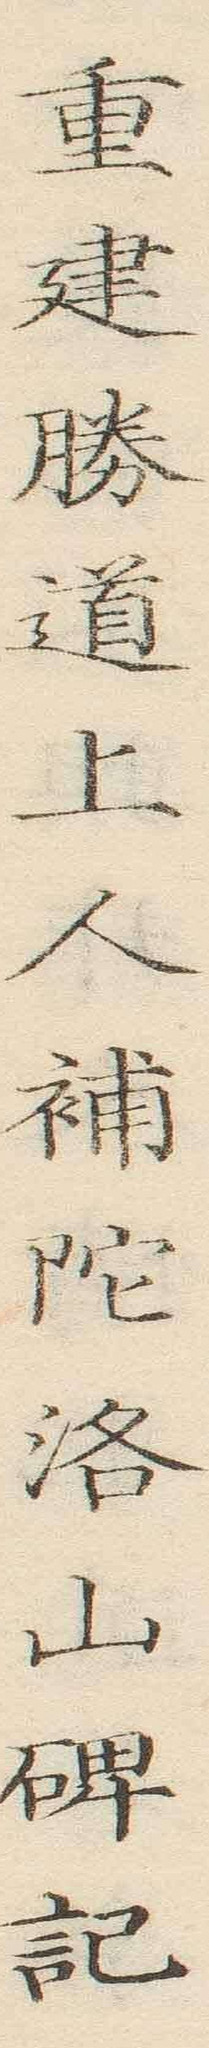重建勝道上人補陀洛山碑記
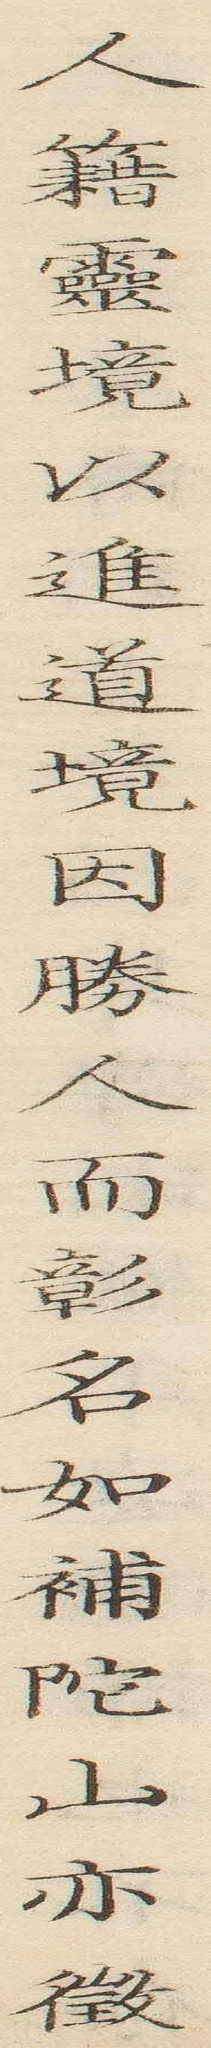人籍靈境以進道境因勝人而彰名如補陀山亦徵
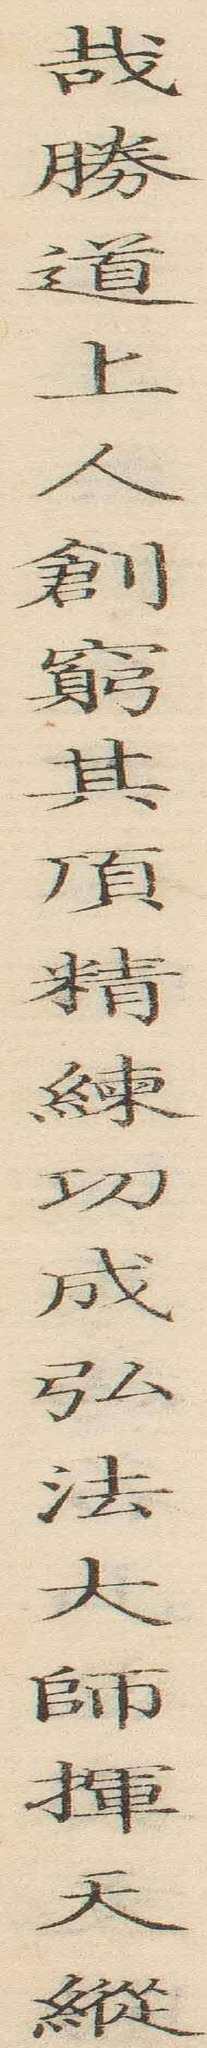哉勝道上人創窮其頂精練㓛成弘法大師揮天縱

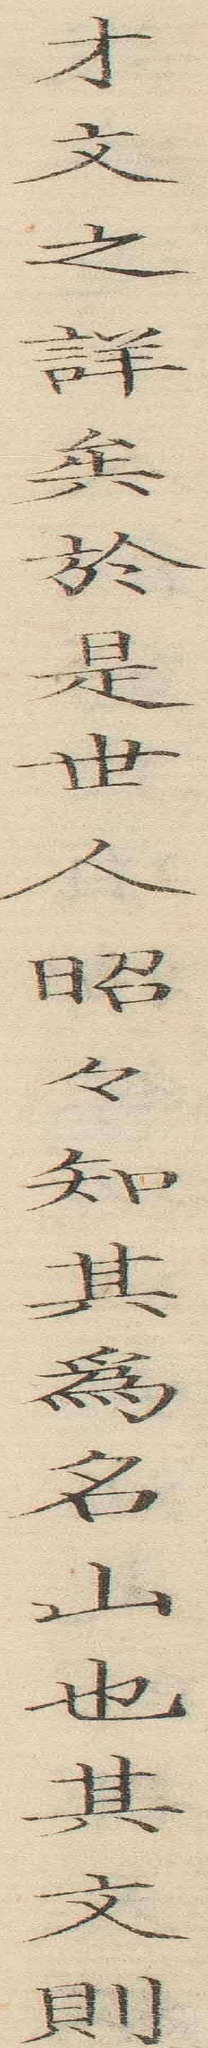才文之詳矣於是世人昭々知其爲名山也其文則
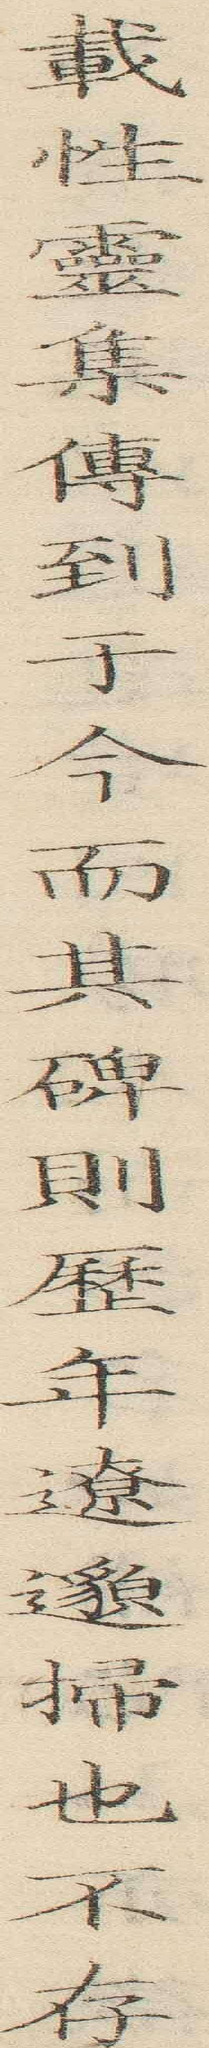載性靈集傳到于今而其碑則歷年遼邈掃也不存
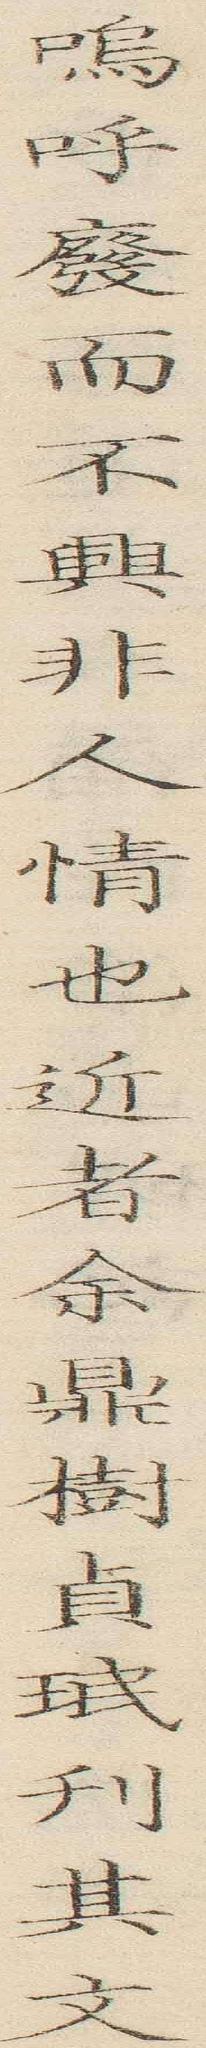嗚呼廢而不興非人情也近者余鼎樹貞珉刋其文
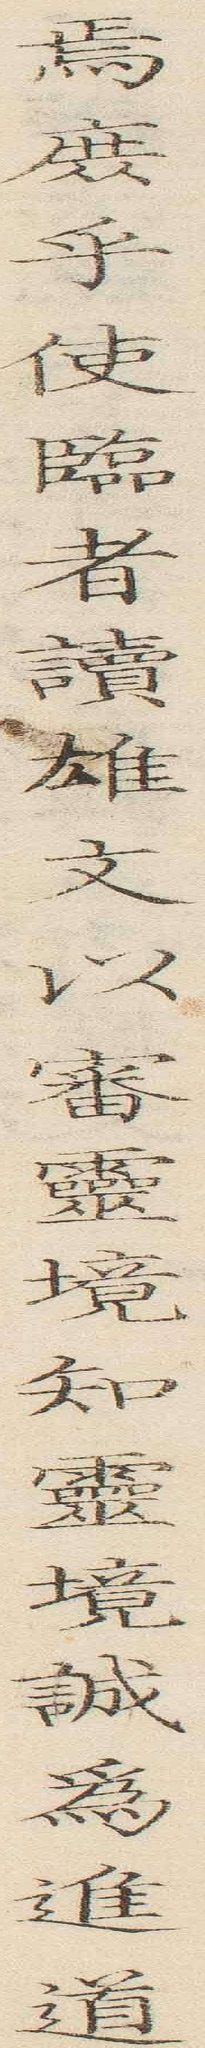焉庻乎使臨者讀雄文以審靈境知靈境誠爲進道
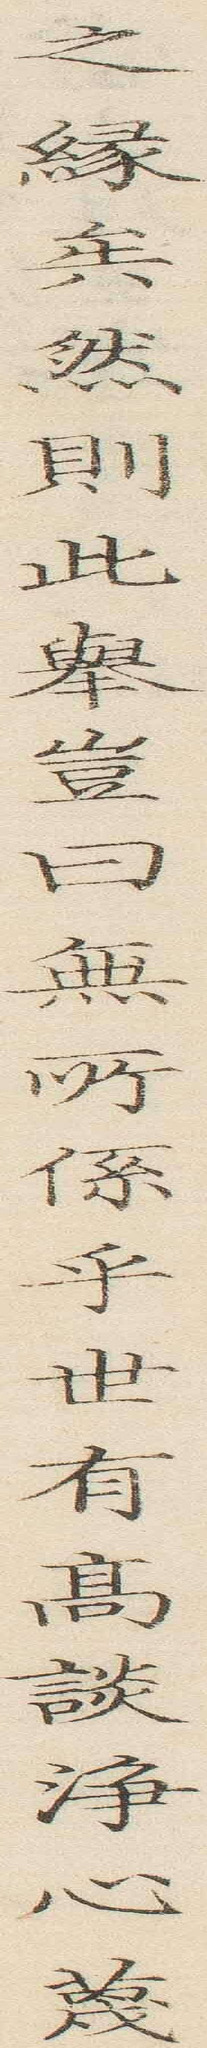之縁矣然則此舉豈曰無所係乎世有髙談浄心蔑
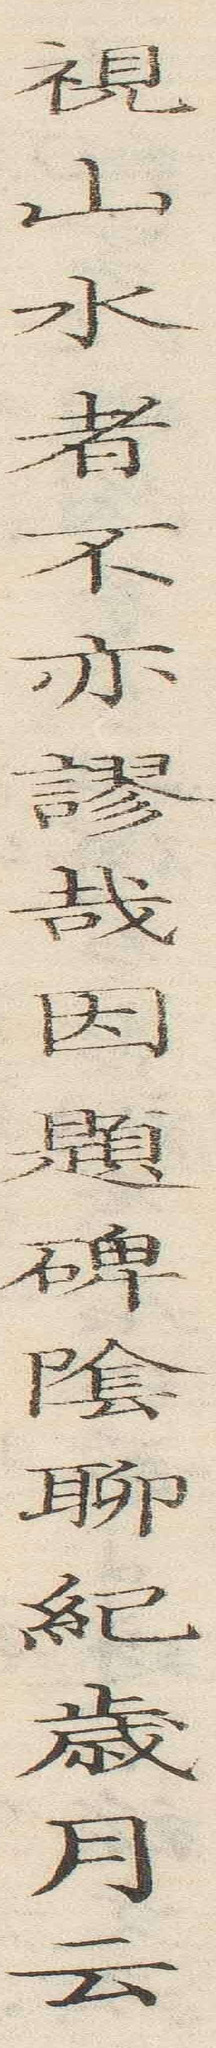視山水者不亦謬哉因題碑隂聊紀歳月云
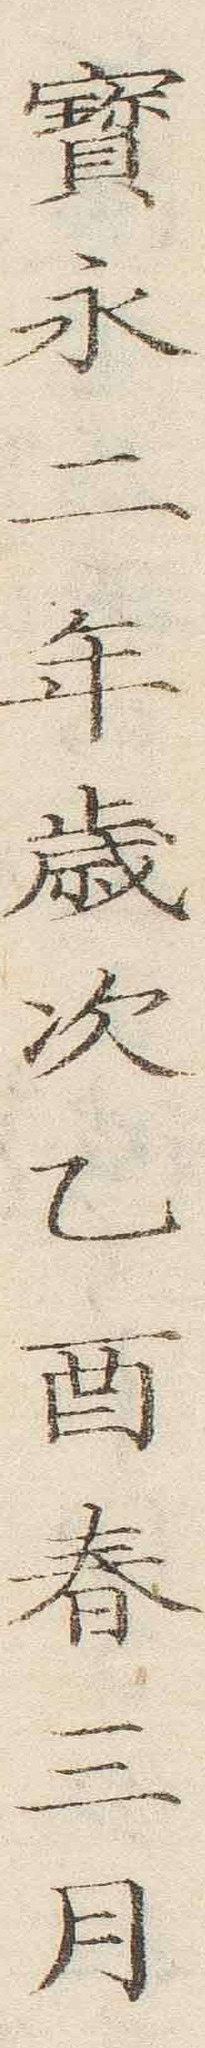寶永二年歳次乙酉春三月
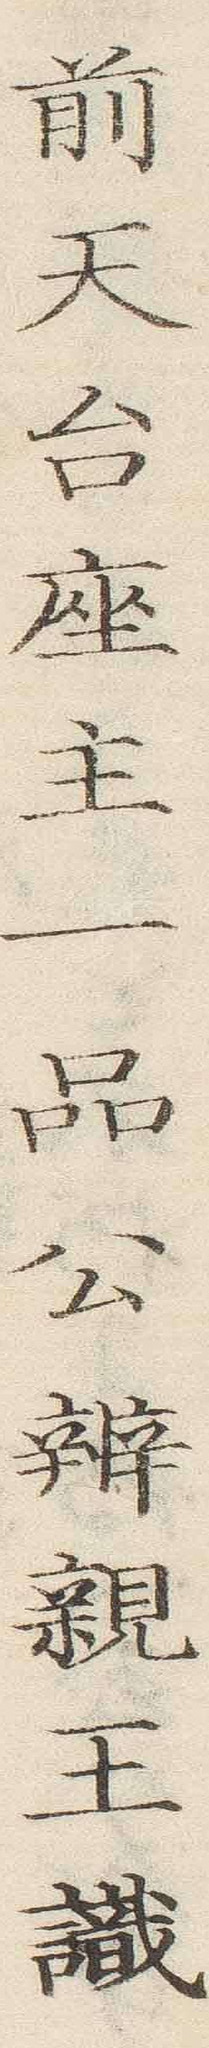前天台座主一品公辨親王識
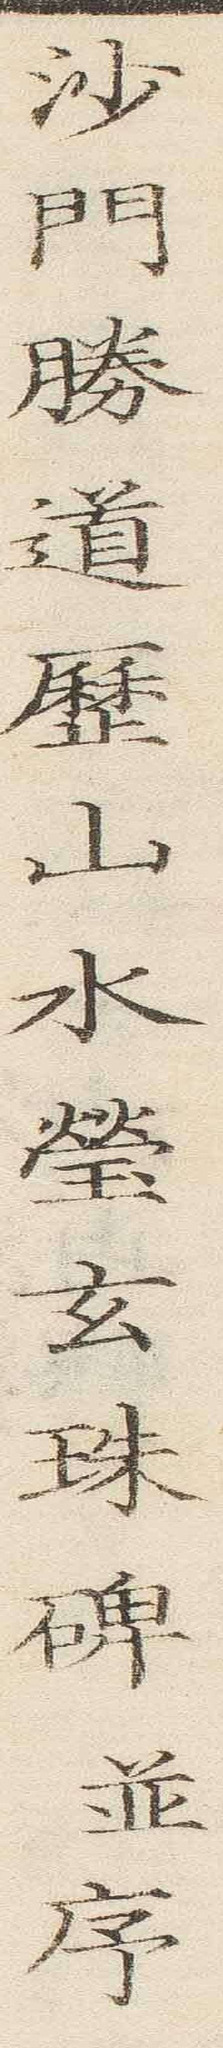沙門勝道歷山水瑩玄珠碑並序
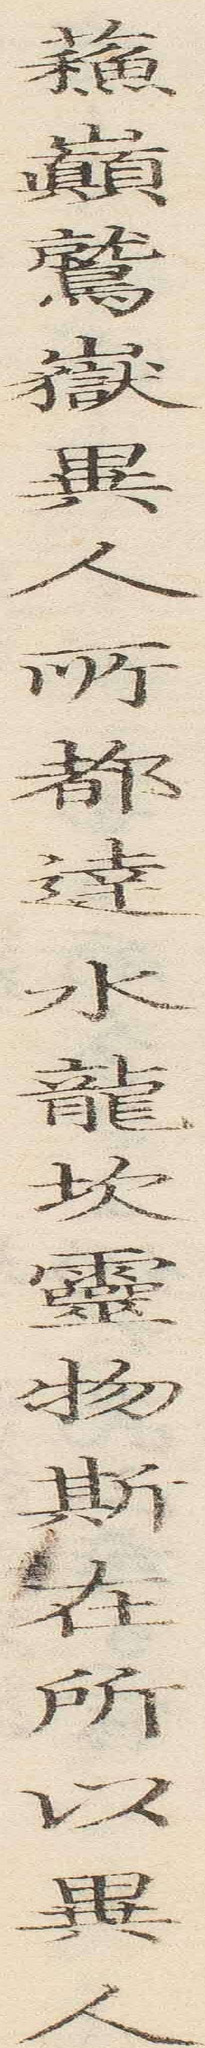蘓巓鷲嶽異人所都達水龍坎靈物斯在所以異人
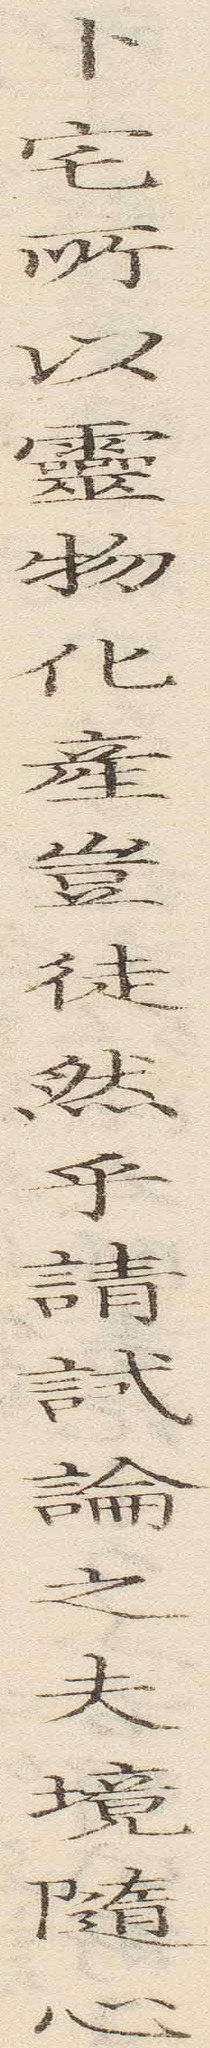卜宅所以靈物化産豈徒然乎請試論之夫境隨心
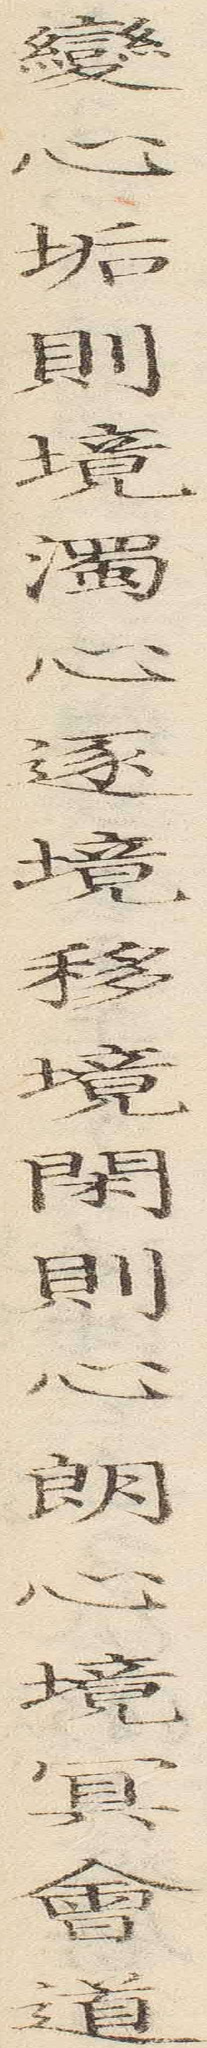變心垢則境濁心逐境移境閑則心朗心境冥會道
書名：日光山志
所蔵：東京学芸大学附属図書館 国文学研究資料館
